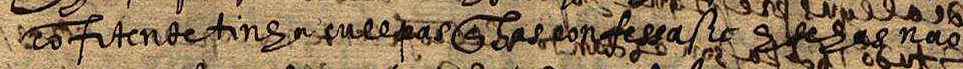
cōfitente tinha cullpas q̄ has confessase E se as não
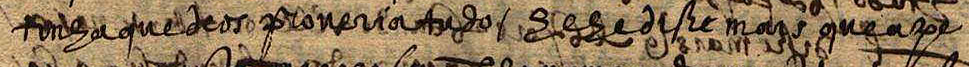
tinha que deos proueria tudo / E lhe disse mais que a pe
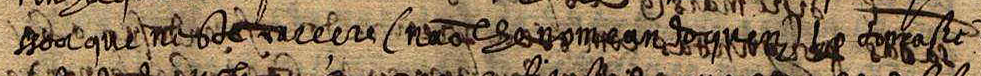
ssoa que neste carcere / não lhe nomeando quem ho tomasse
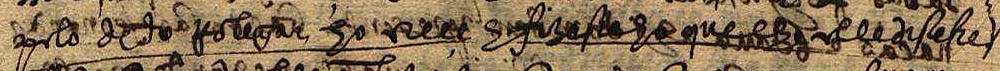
pelo dedo polegar ho crece E fizesse ho que lhe elle dissesse
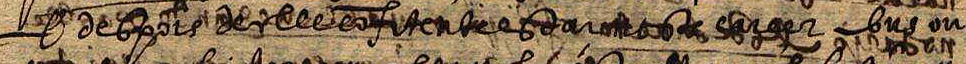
E despois de elle cōfitente estar neste carcer dous ou
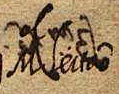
Mel leitaõ
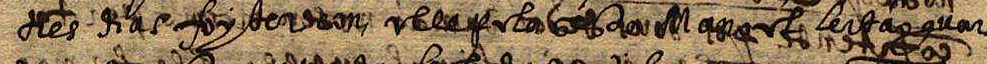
tres dias foy ter com elle pela sesta Manoel leitao guar
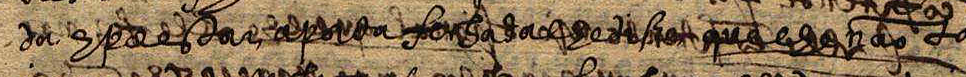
da E por estar a porta fechada lhe disse que lhe não to
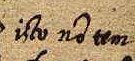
isto nō tem
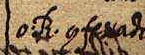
o R. ꝯfessado
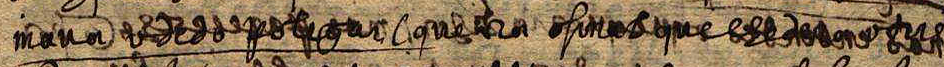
maua o dedo polegar (que era o sinal que lhe dera tris
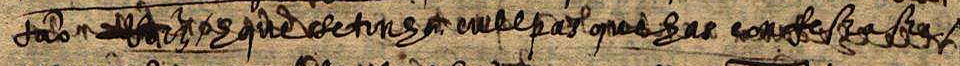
tão Roīz) E que se tinha cullpas que has confessasse
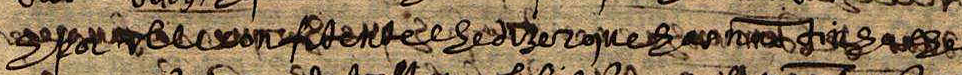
E por elle confitente lhe dizer que has não tinha lhe
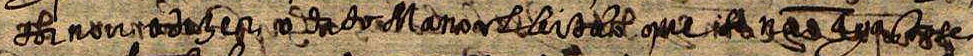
tornou a dizer o dito Manoel leitão que se não agastase
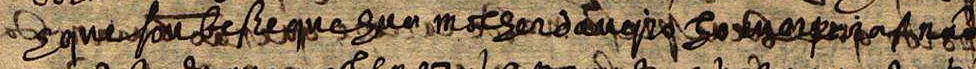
E que soubesse que hua molher dauejro ho cullpara naõ
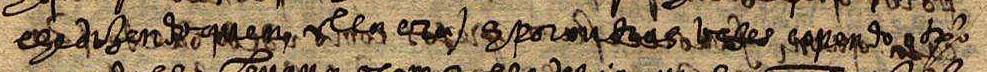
lhe dizendo quem ella era / E por outras vezes correndo o tp̄o
